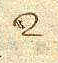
2
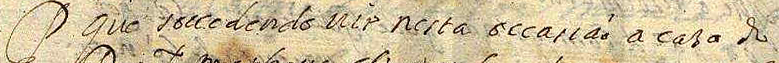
P que soccedendo uir nesta occasiaõ a caza do
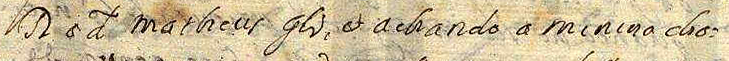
R o d̄ matheus glz̄, e achando a minina cho
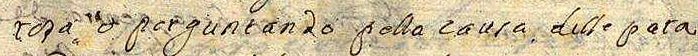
roza, & perguntando pella causa disse pera
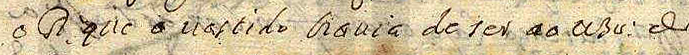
o R que o uestido hauia de ser ao uzo: &
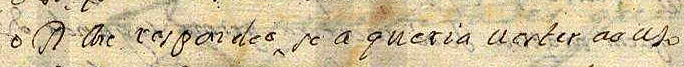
o R lhe respondeo se a queria uerter ao uso
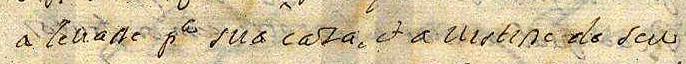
a leuasse pa sua caza, & a uestisse de seu
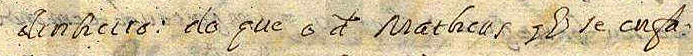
dinheiro: do que o d̄ Matheus glz se enfa
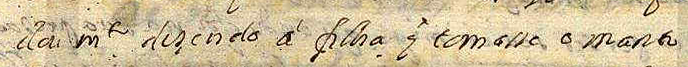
dou mto dizendo à filha q̄ tomasse o manto
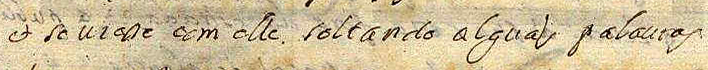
& se uiesse com elle soltando alguās palauras
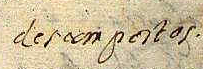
descompostos.
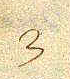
3
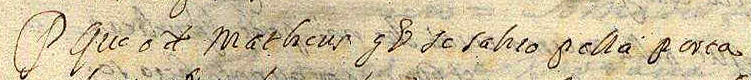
P que o d̄ Matheus glz se sahio pella porta
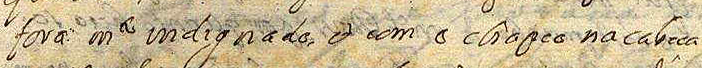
fora mto indignado, & com o chapeo na cabeça
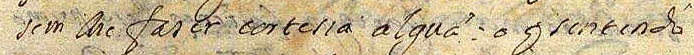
sem lhe faser cortesia alguā: o q̄ sentindo
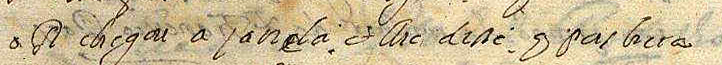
o R chegou a janela, & lhe disse q̄ pas hera
